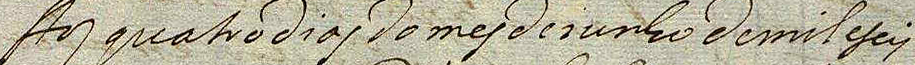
Aos quatro dias do mes de iunho de mil e seis
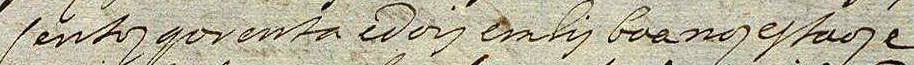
Centos qorenta e dois em lisboa nos estaos e
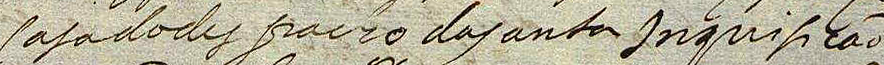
Casa do despacho da santa Jnquisicaõ
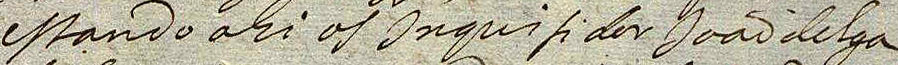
estando ahi o sor Jnquisidor Joaõ delga
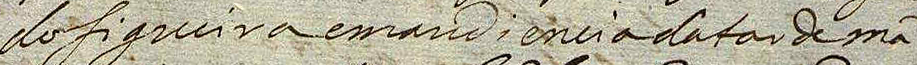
do figueira em audiencia da tarde mā
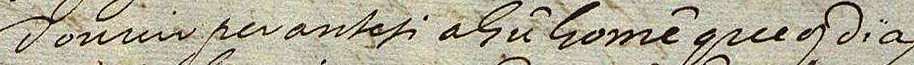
dou uir perante si a hū homē que os dias
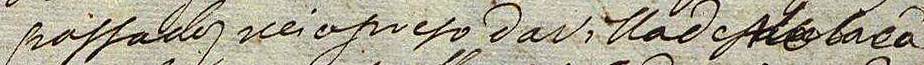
passados ueio preso da villa de Alcobaca
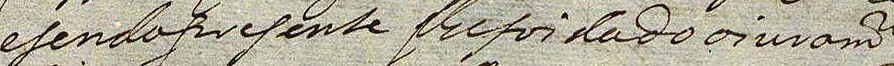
e sendo presente lhe foi dado o iuramto
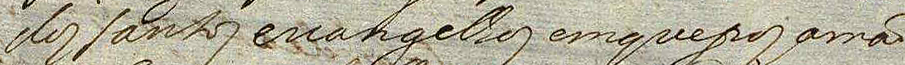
dos santos euangelhos em que pos a maõ
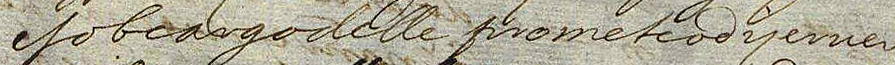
e sob cargo delle prometeo dizer uer
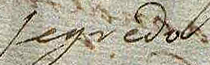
segredo
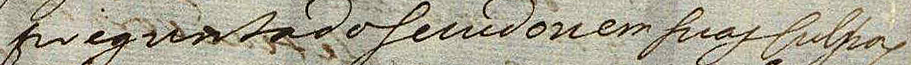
preguntado se cudou em suas Culpas
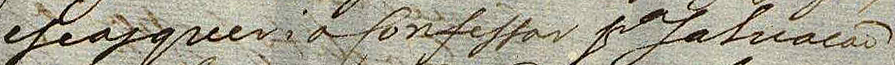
e se as queria Confessar pa saluacaõ
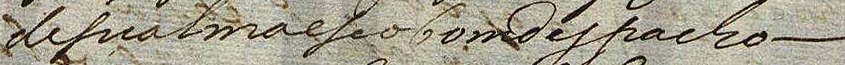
de sualma e seo bom despacho -
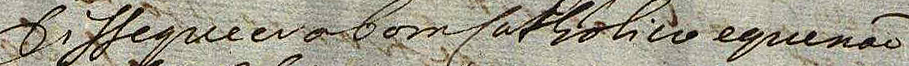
Disse que era bom Catholico e que naõ
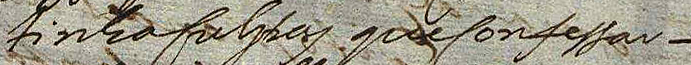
tinha Culpas que Confessar
